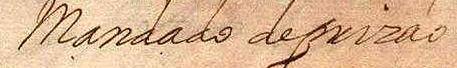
Mandado de prizão
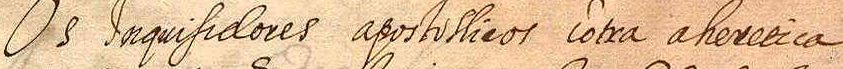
Os Inquisidores apostollicos cōtra a heretica
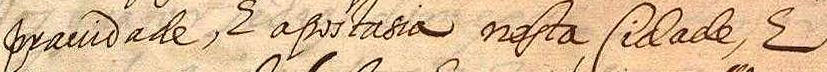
prauidade, E apostasia nesta Cidade, E
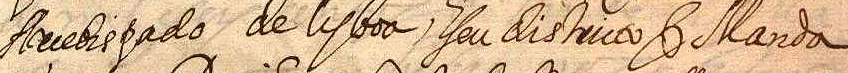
Arcebispado de lisboa, E seu districto & Manda
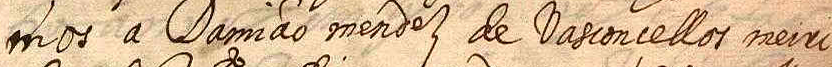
mos a Damião mendez de Vasconcellos meiri
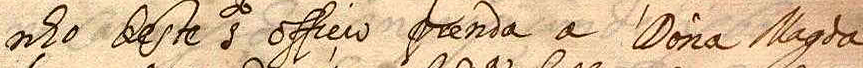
nho deste sto officio prenda a Dona Magda
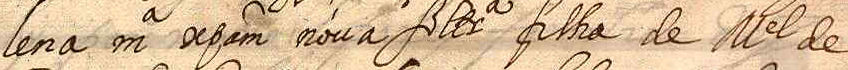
lena ma xpām noua soltra filha de Mel de
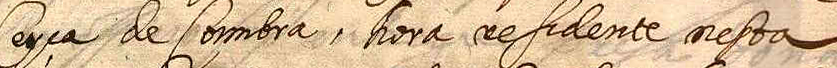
Ceyça de Coimbra, hora residente nesta
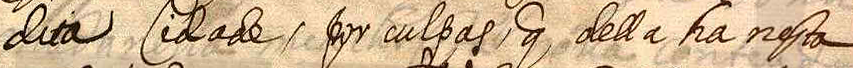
dita Cidade, por culpas, q̄ della ha nesta
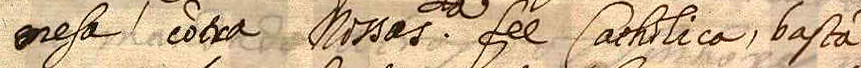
mesa / cōtra nossa s.ta fee Catholica, bastā
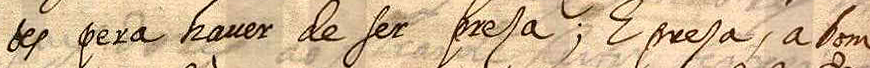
tes pera hauer de ser preza; E preza, a bom
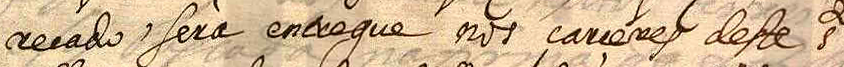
recado, serà entregue nos carceres deste sto
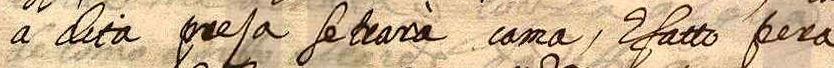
a dita preza se trarà cama, E fatto pera
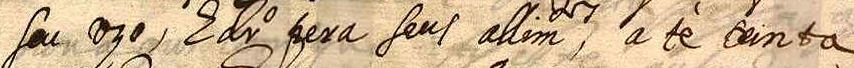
seu vzo, E dro pera seus allimtos, atè trinta
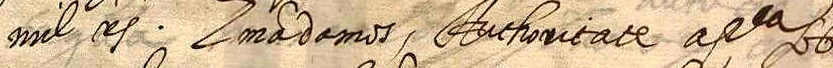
mil rs̄. E mādamos, Authoritate apca sob
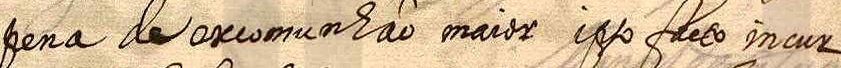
pena de excomunhaõ maior ipso facto incur
